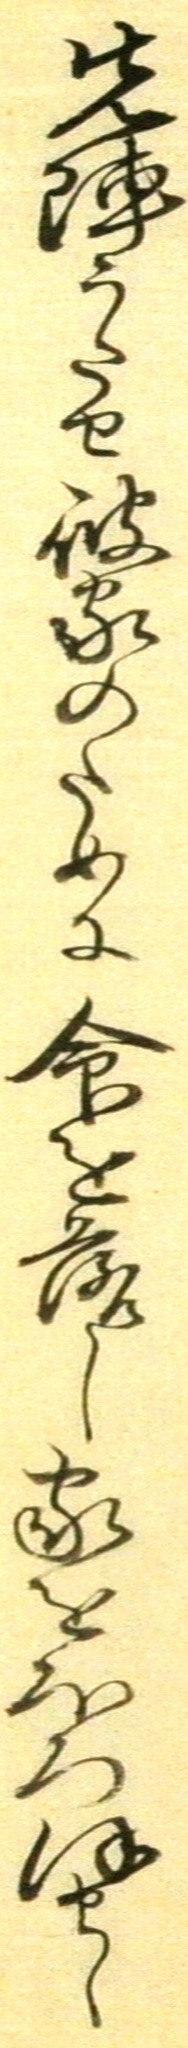先陣うたせ彼家のために命を落し家をほろほせし
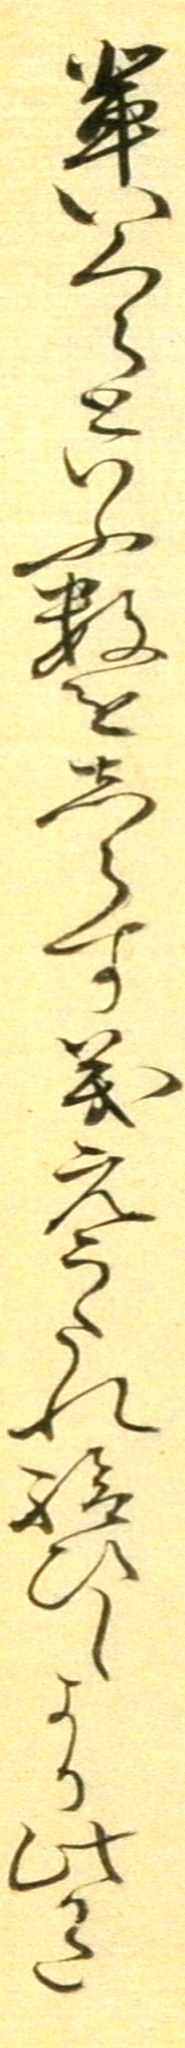輩いくらといふ数をしらす義元うたれ給ひしより此かた
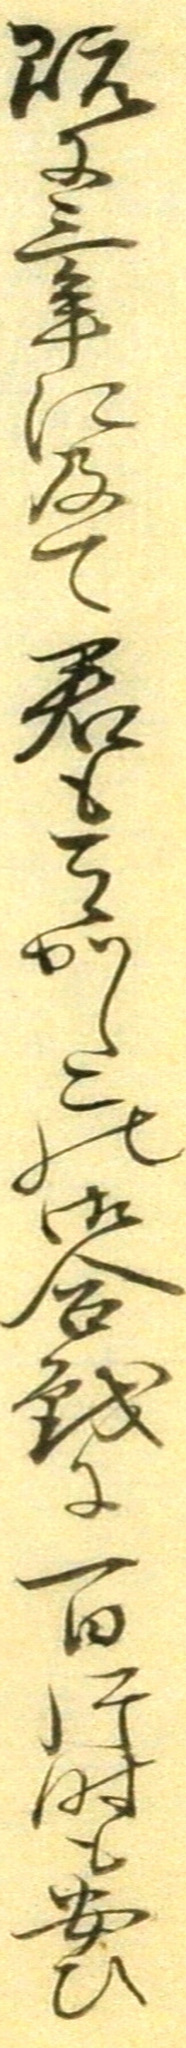既に三年に及て君もこゝかしこの御合戦に一日片時も安ひ
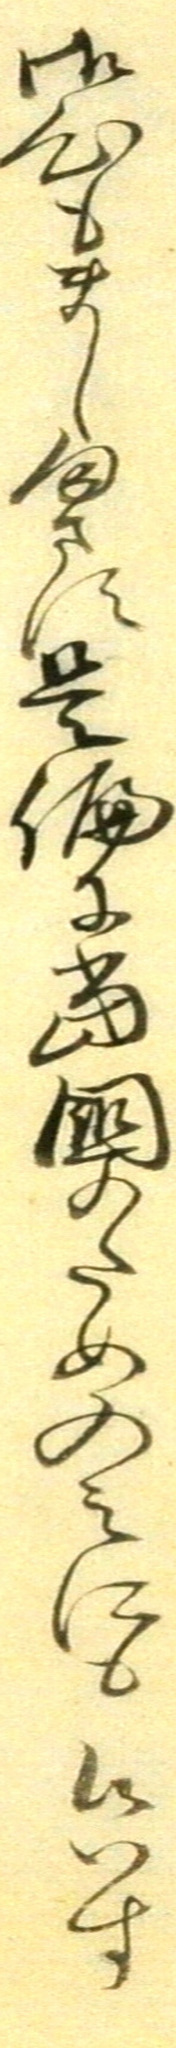御心もましまさす是偏に当国のためのみにも候はす
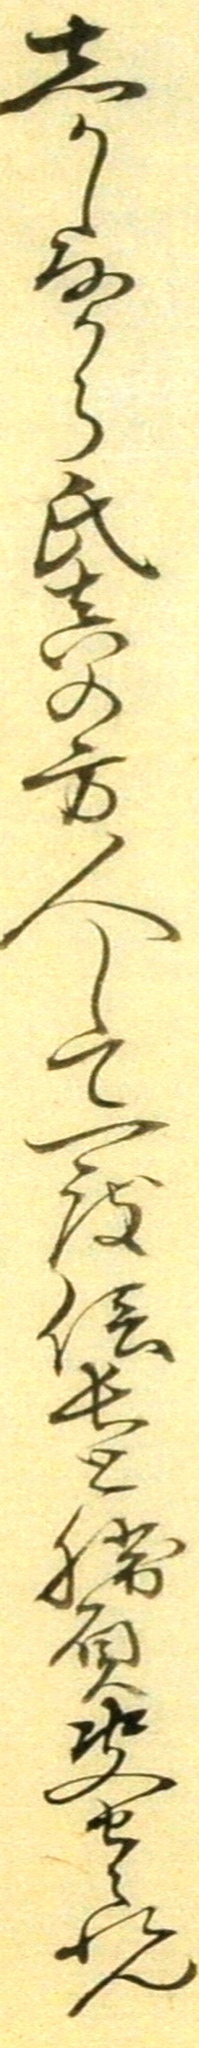しかしなから氏真の方人して一度信長と勝負決せられん
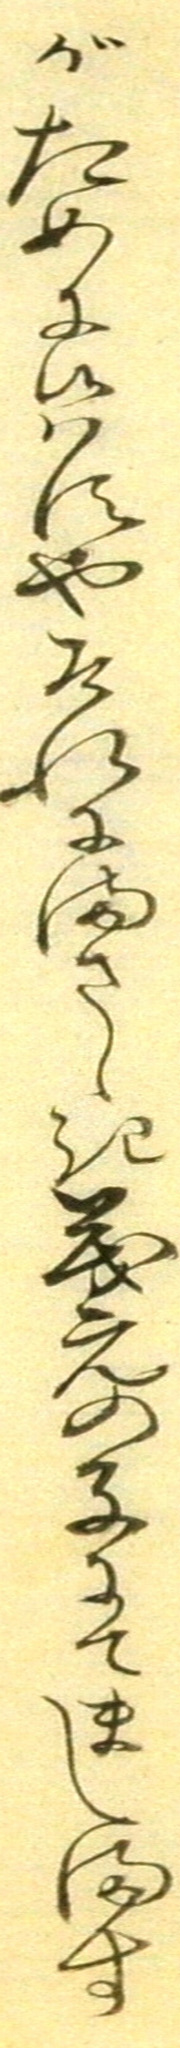がために候はすやそれにまさしき義元の子にてまします
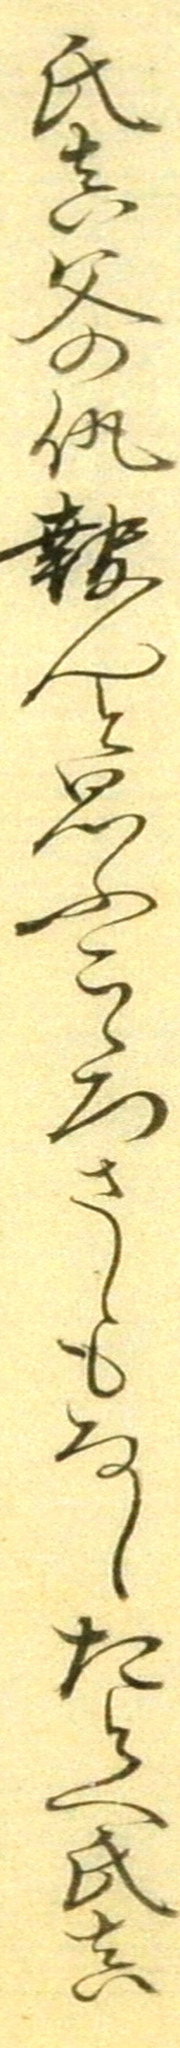氏真父の仇報んと思ふこゝろさしもなしたとへ氏真
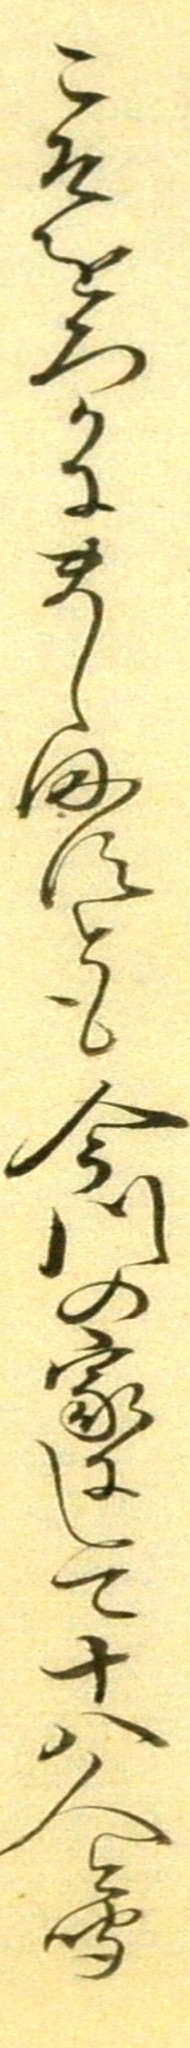こそをろかにましますとも今川の家にして十八人と聞
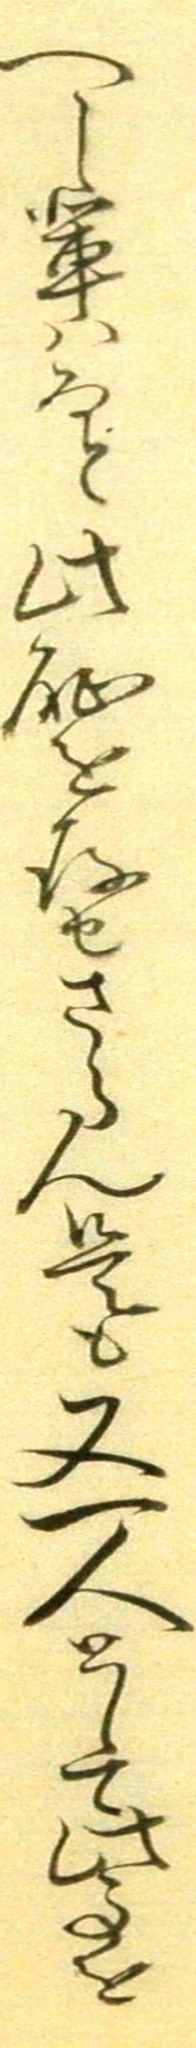へし輩はなと此恥を存せさらん是も又一人として此事を
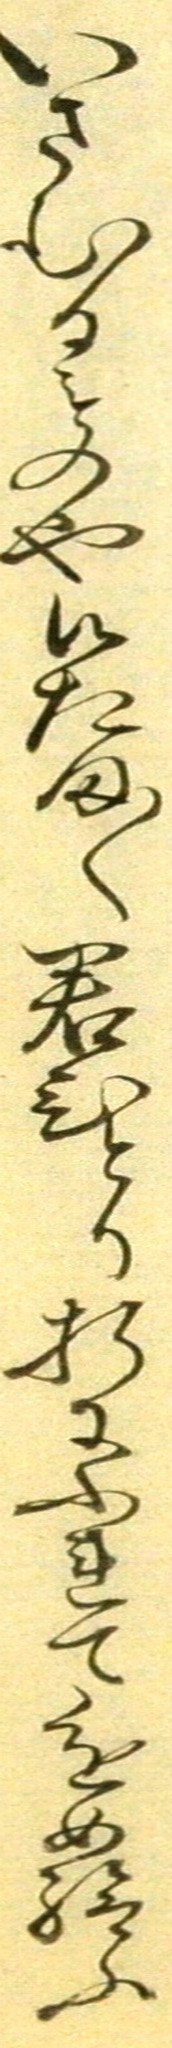いさむるものや候たま〳〵君ひとり折にふれて進め給ふ
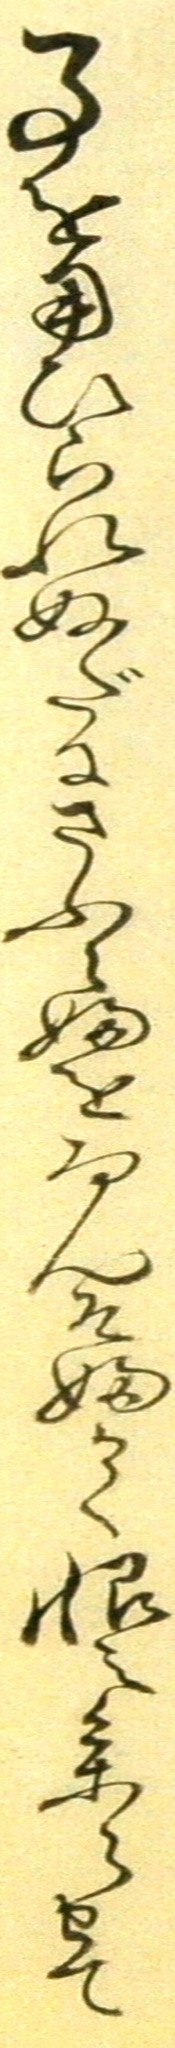事を用ひられぬだにさふらふをなんそふかく恨み参らせて
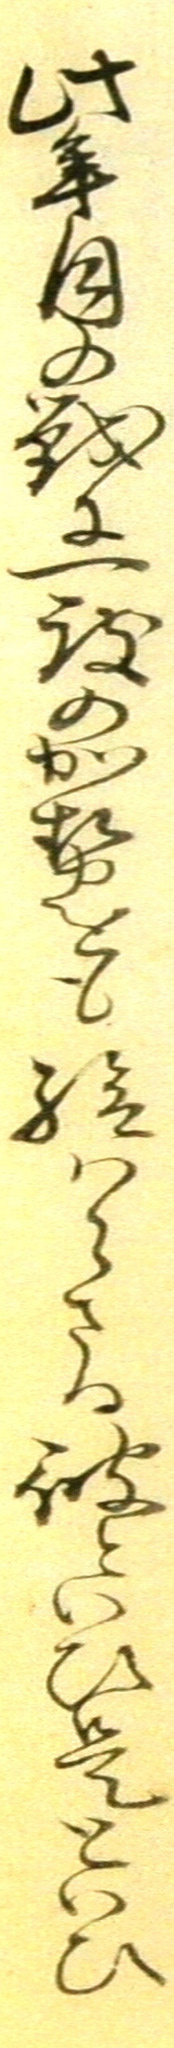此年月の戦に一度の加勢をも給はらさる彼といひ是といひ

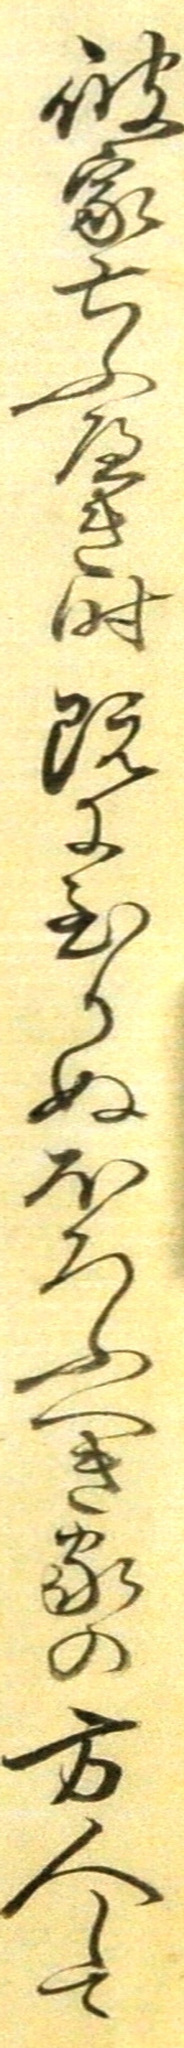彼家亡ふへき時既に至りぬほろふへき家の方人して
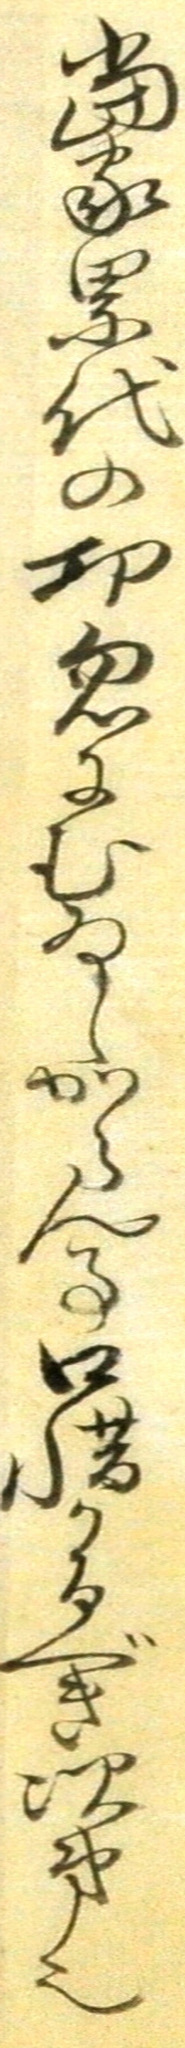当家累代の功忽にむなしからん事口惜かるべき次第也
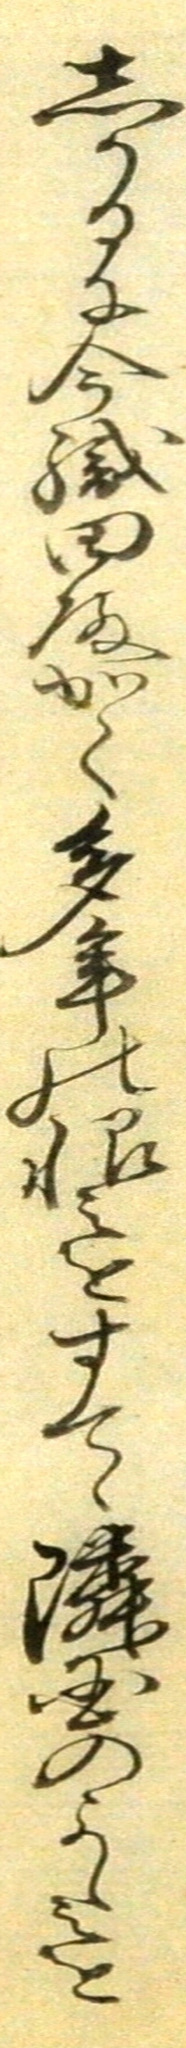しかるに今織田殿かく多年の恨みをすてゝ隣国のよしみを
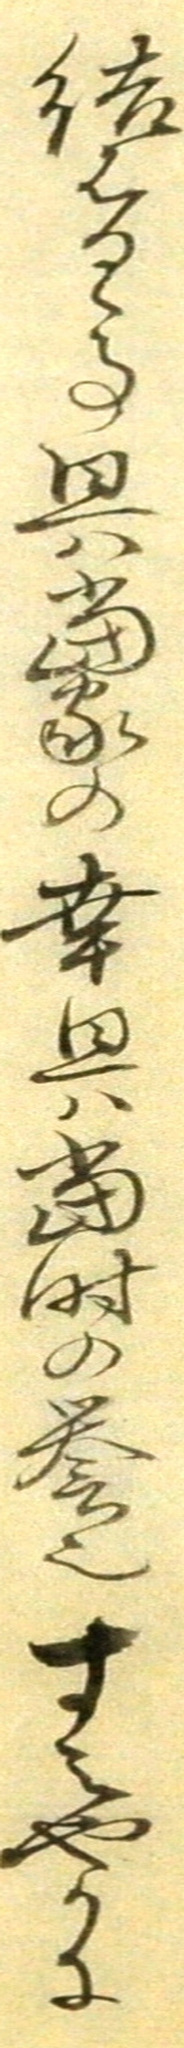結はるゝ事且は当家の幸且は当時の誉也すみやかに
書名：藩翰譜（五）
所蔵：伊那市立高遠町図書館・合同会社AMANE
